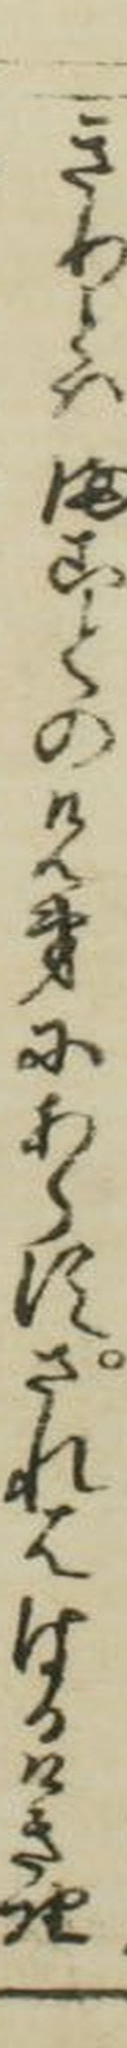きりとはまことの兄弟にあらす。されははるけき野
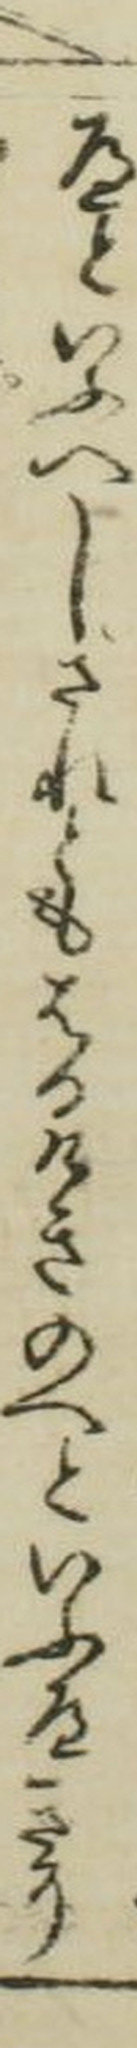へといふへしされともはるけきのへといふへきに
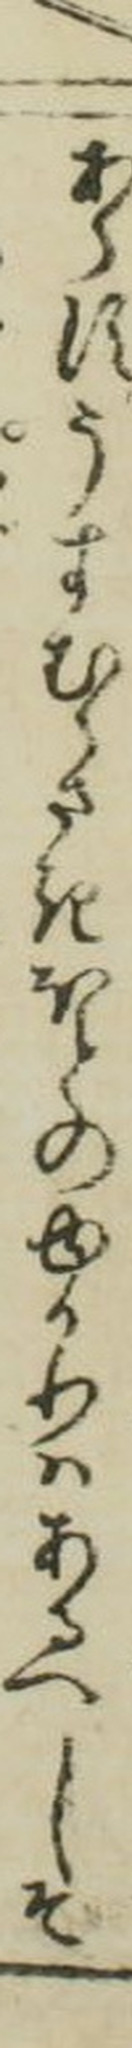あらす。うすむらさきほとのゆかりはあるへしそ
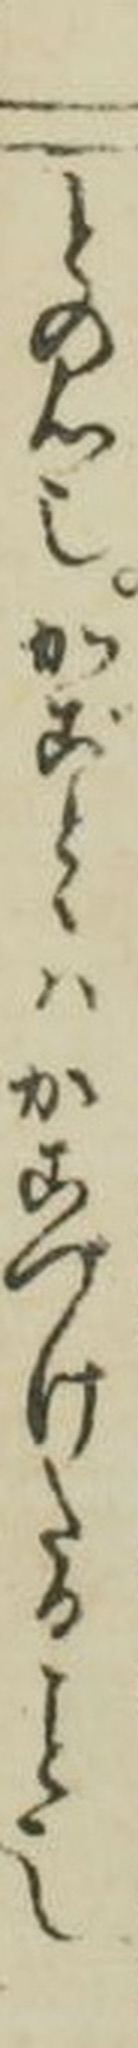との心也。かことゝはかこづけたること也
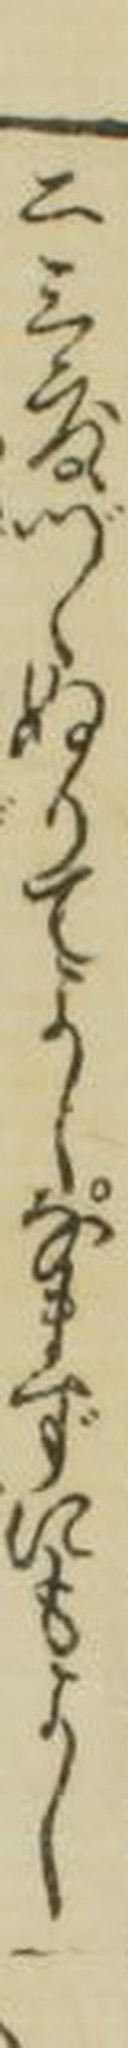二三度づゝぬりてよし。なまずにもよし
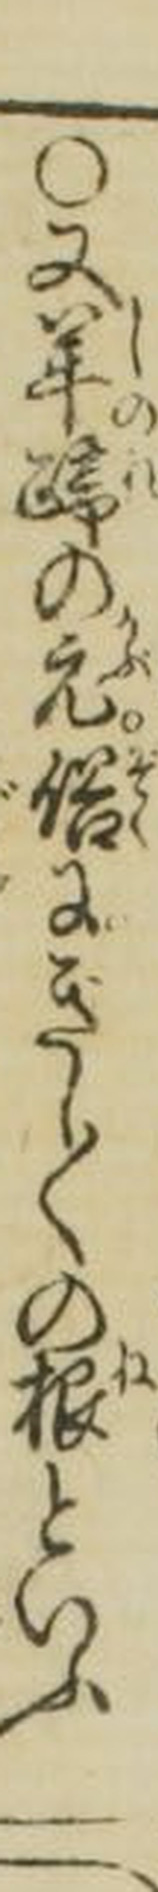◯又羊蹄の元。俗にぎし〳〵の根といふ
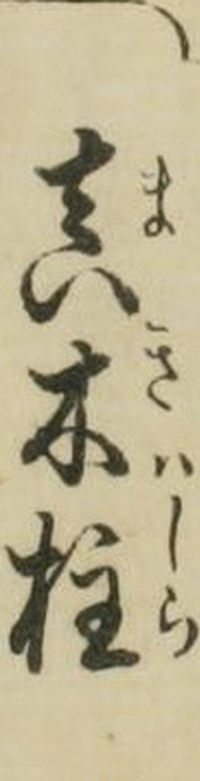真木柱
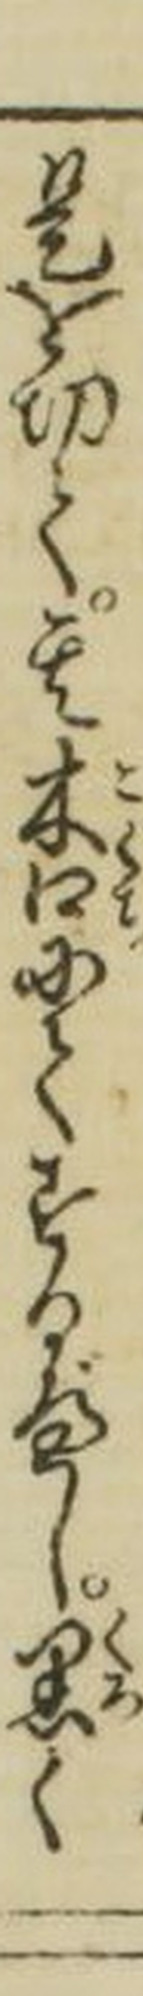是を切て。其木口にてするべし。黒く
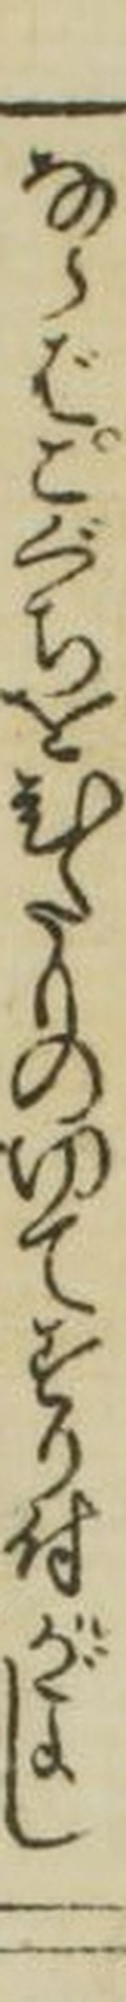ならば。こぐちをひたもの切てすり付るがよし
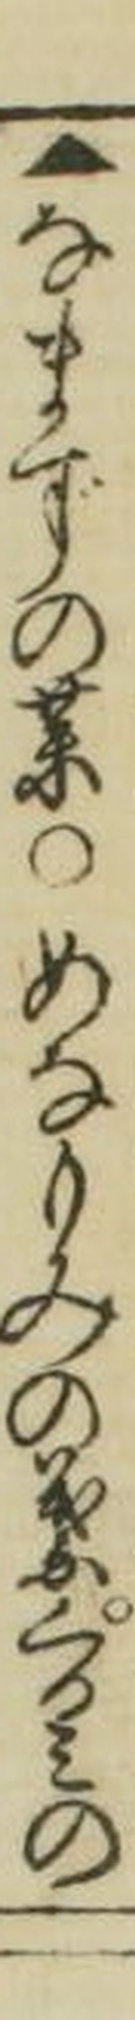▲なまずの薬◯ぬなもみの葉。くるみの
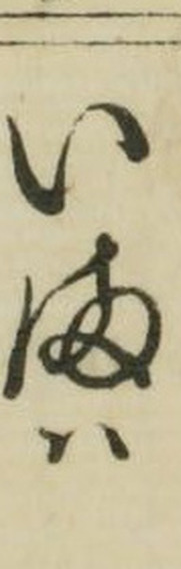いまは
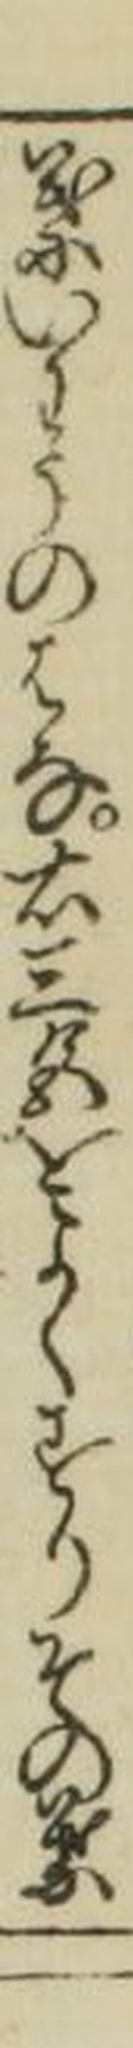葉いわうのはな。右三色をよくすりその葉
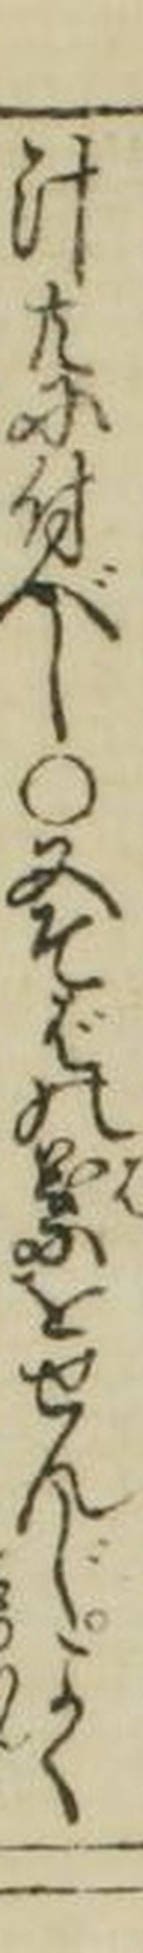汁共に付べし◯又そばの葉をせんじ。よく
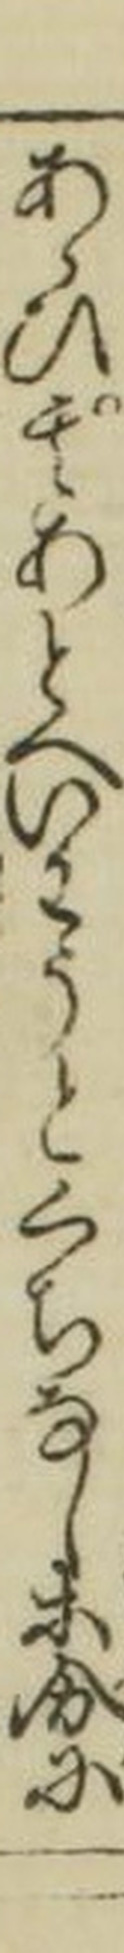あらひ。其あとへいわうとくちなし等分に
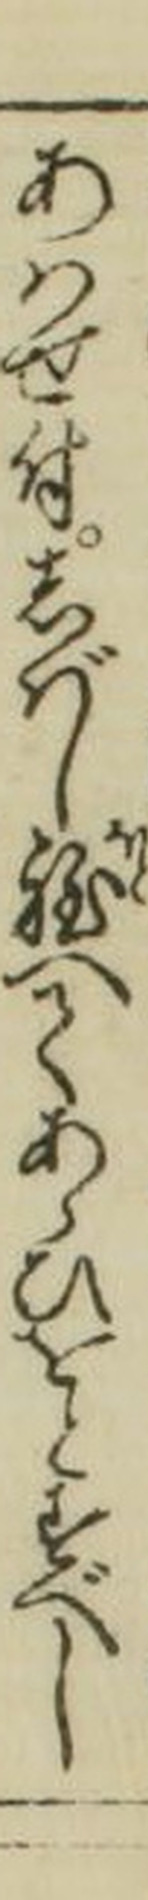あはせ付。しばし程へてあらひをとすべし
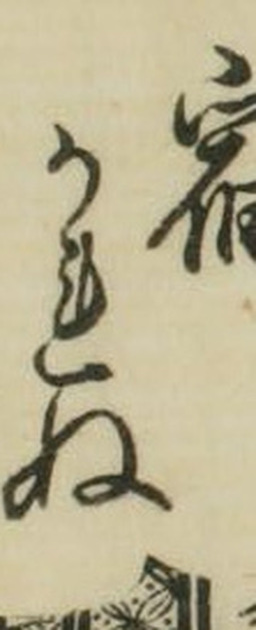かれぬ
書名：女源氏教訓鑑
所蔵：東京学芸大学附属図書館
